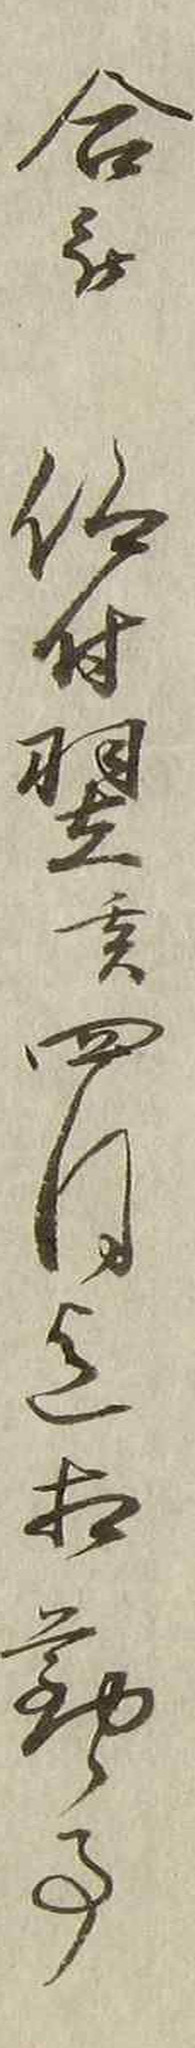合被仰付翌亥四月迄相勤候事
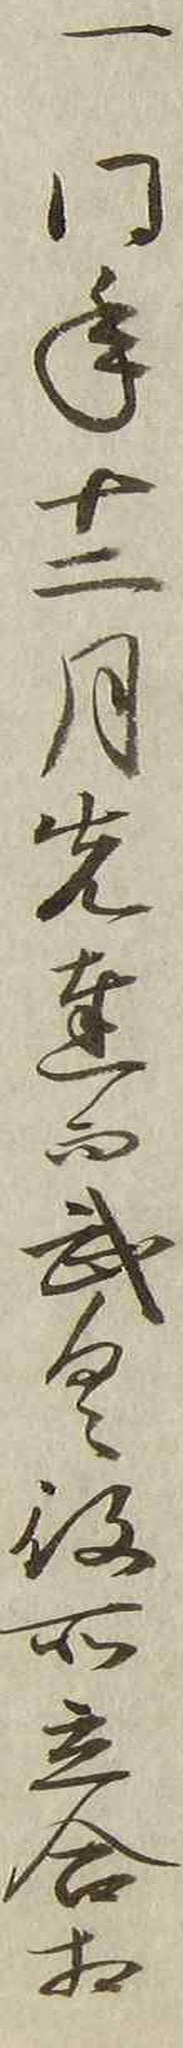一同年十二月先達而武具役所立合相
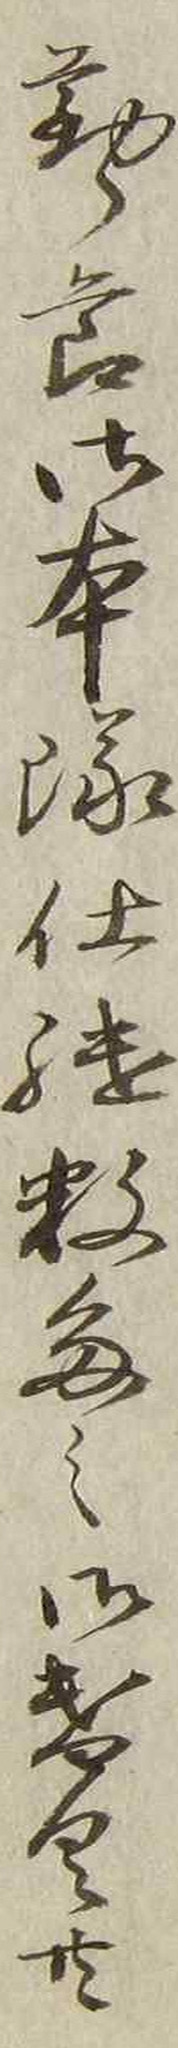勤候節御本隊仕継数多之御替具共
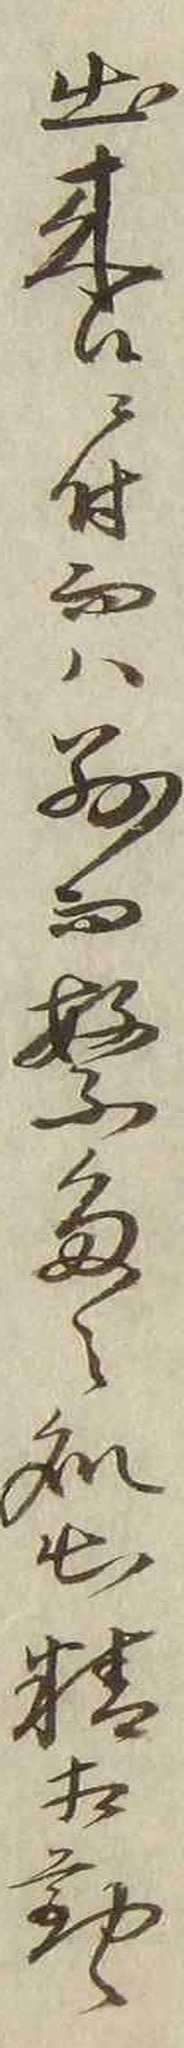出来候ニ付而ハ別而繁多之処出精相動候

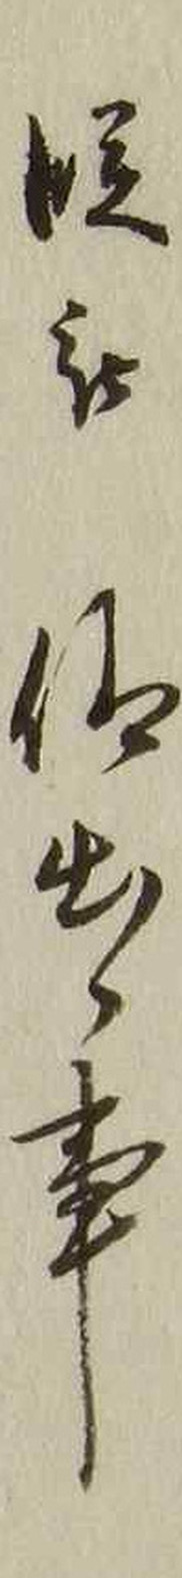段被仰出候事
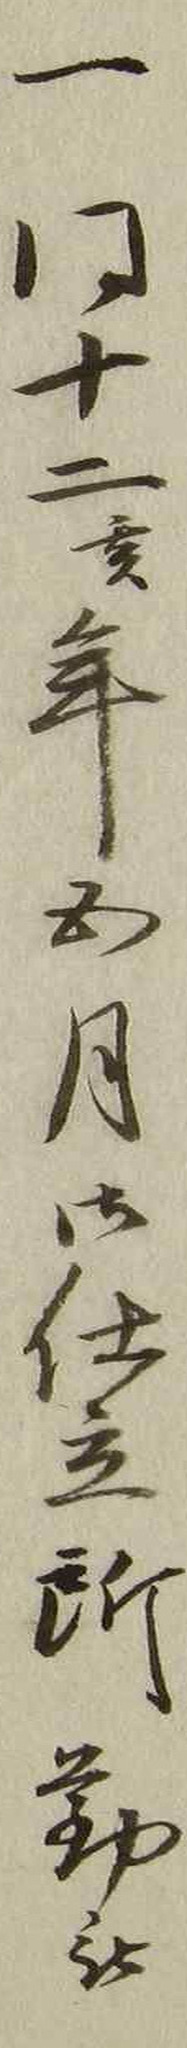一同十二亥年五月御仕立所勤被
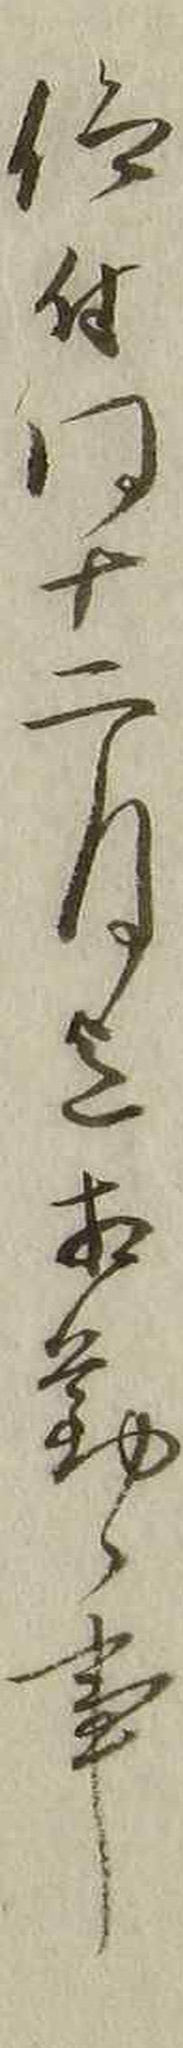仰付同十二月迄相勤候事
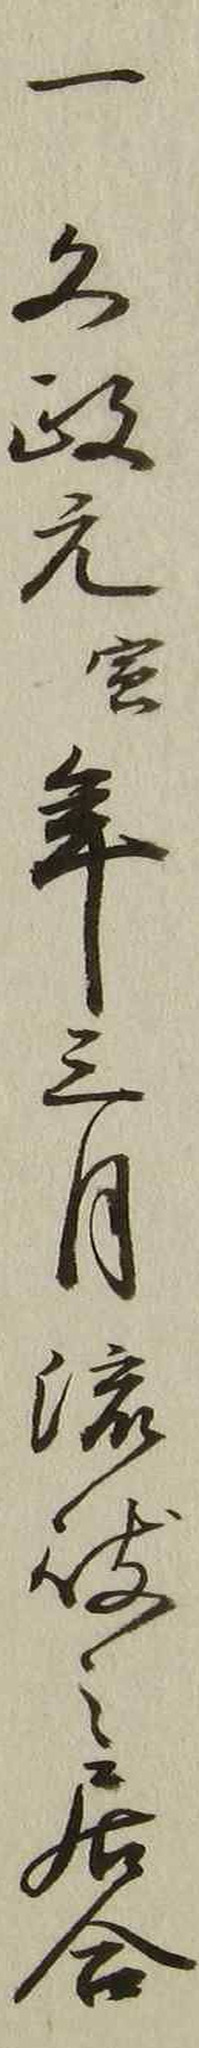一文政元寅年三月流岐之居合
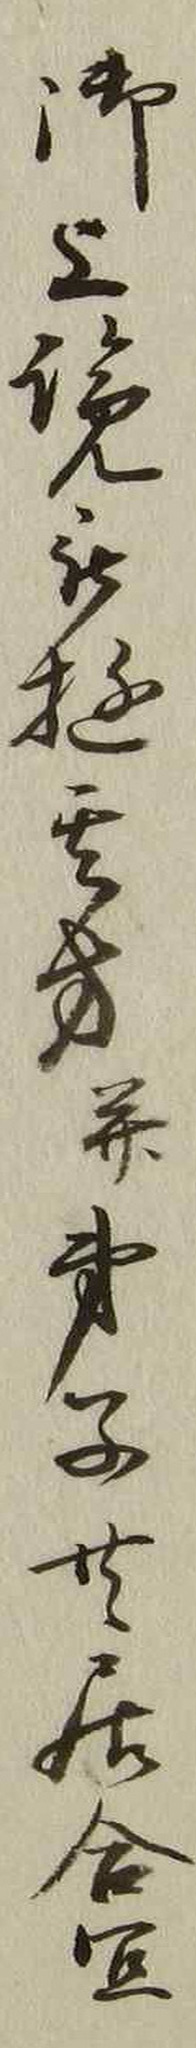御上覧被遊其方并弟子共居合宜
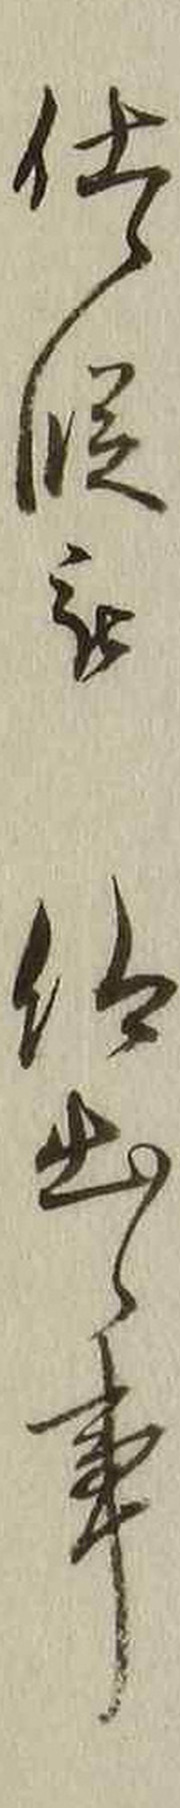仕候段被仰出候事
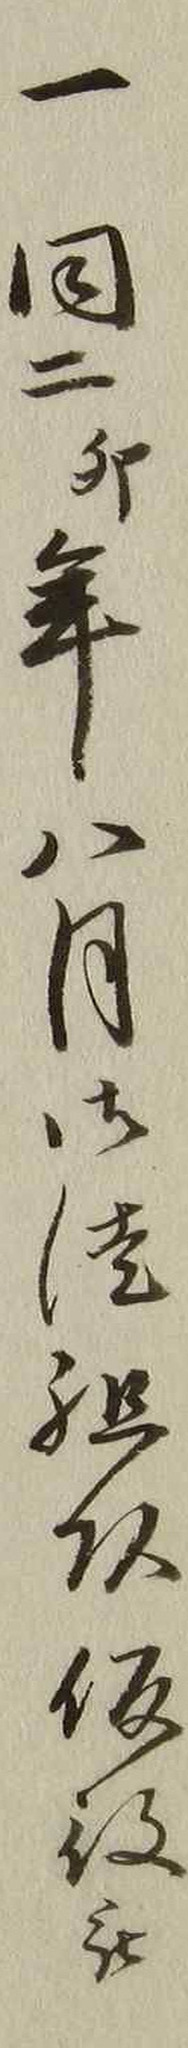一同二卯年八月御徒組頭仮役被
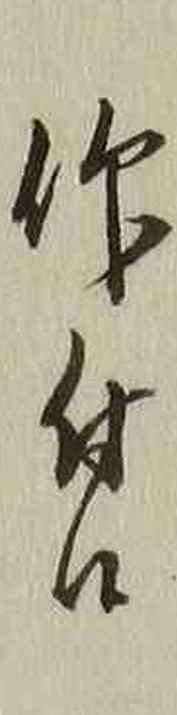仰付候
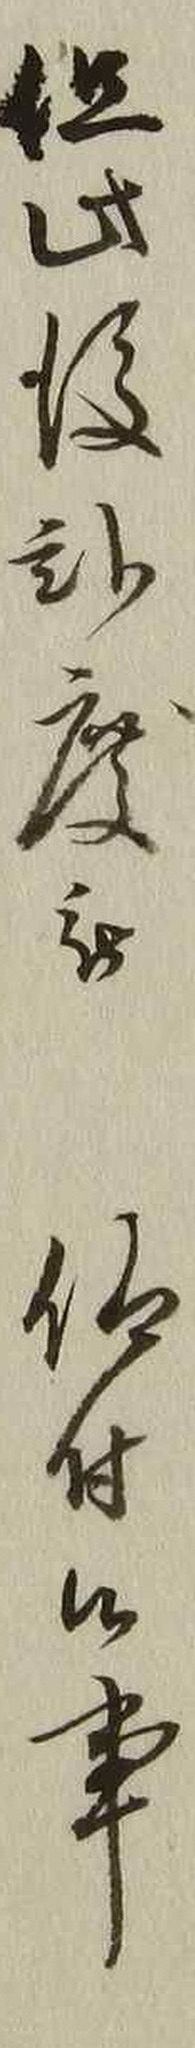但此後弐度被仰付候事
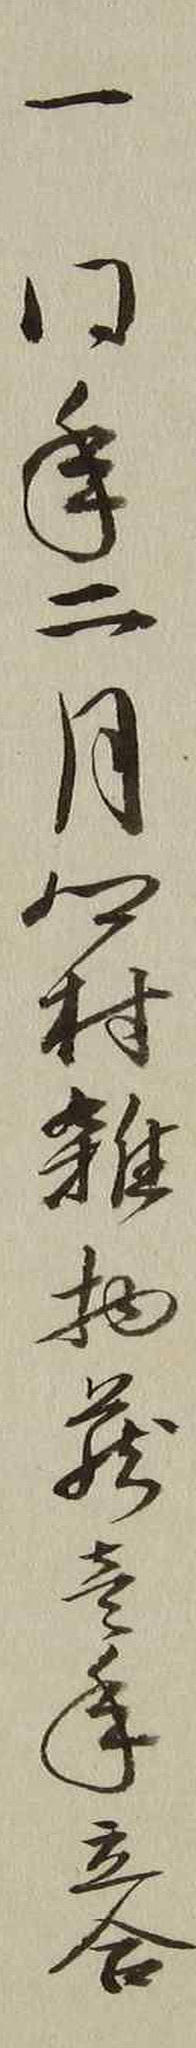一同年二月郷村雑物蔵壱年立合
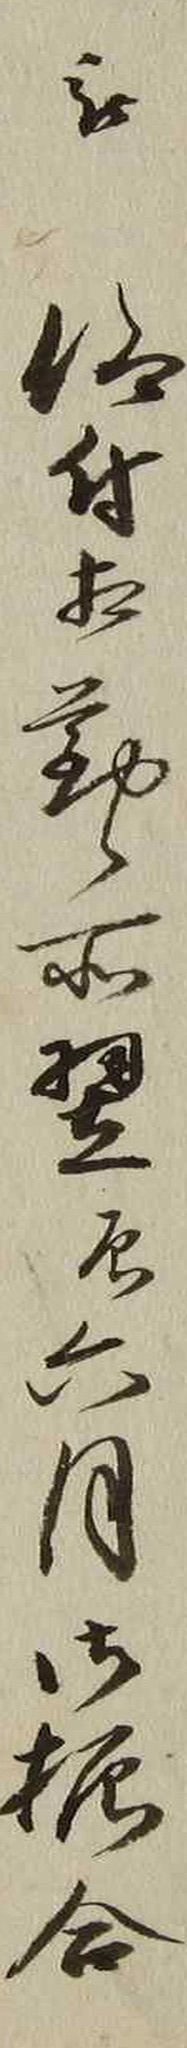被仰付相勤候所翌辰六月御振合
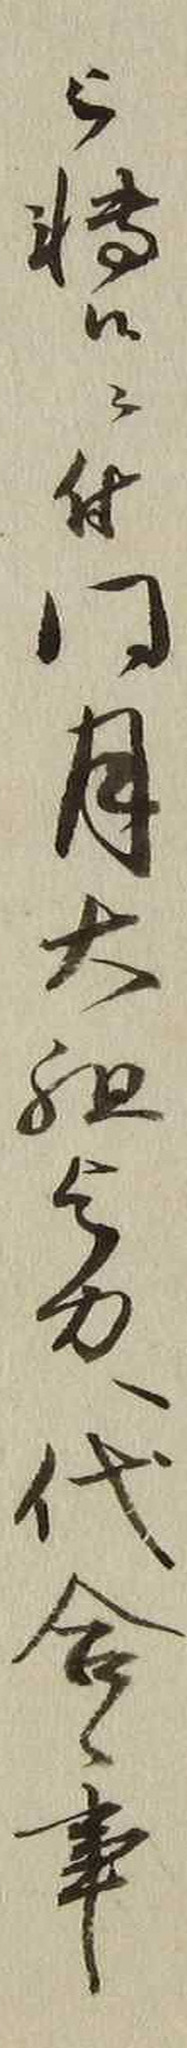被転候ニ付同月大組与力へ代合候事
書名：諸士系譜　巻之102　か之部10
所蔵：会津若松市立会津図書館
